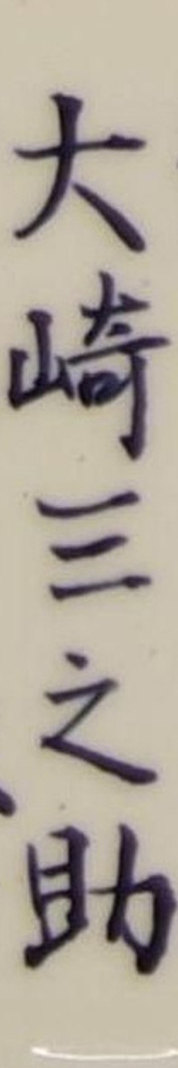大崎三之助
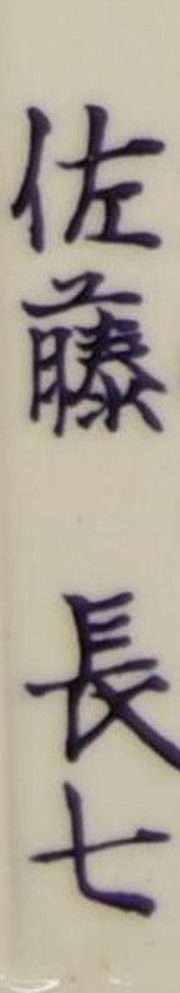佐藤長七

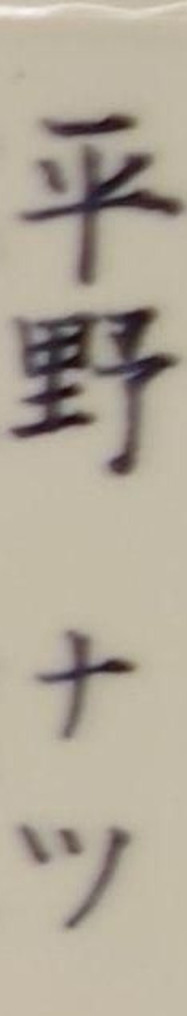平野ナツ
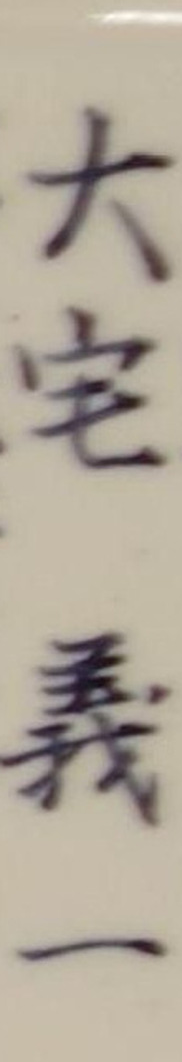大宅義一
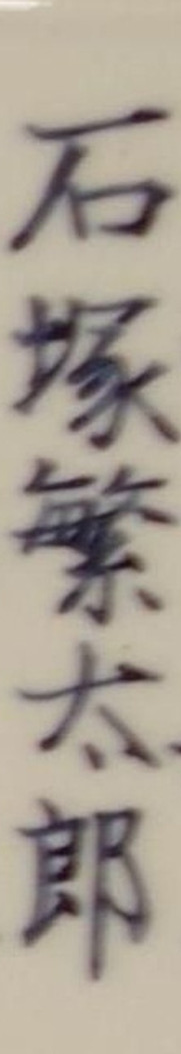石塚繁太郎
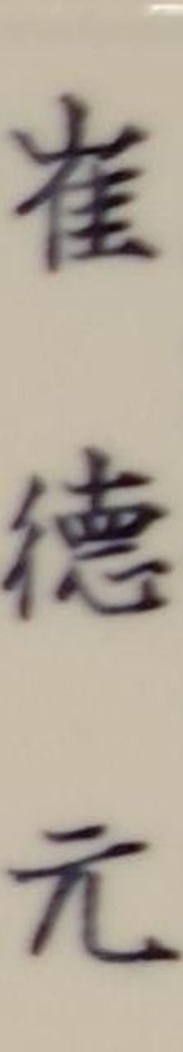崔徳元
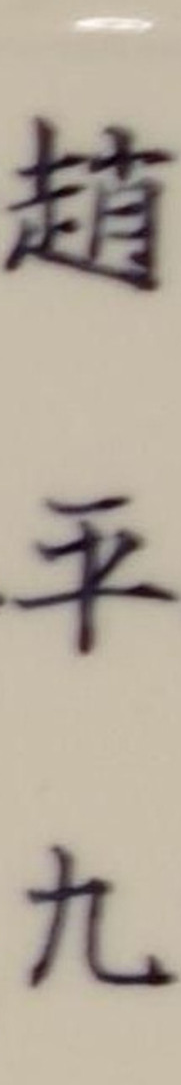趙平九
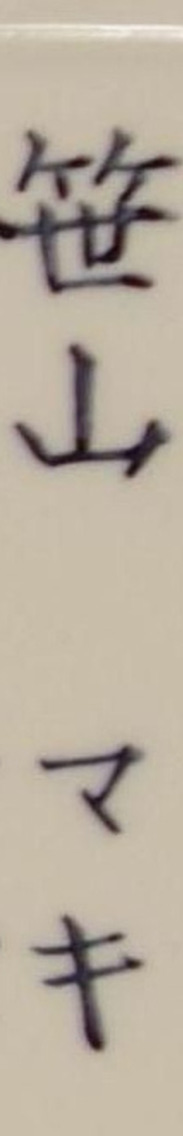笹山マキ
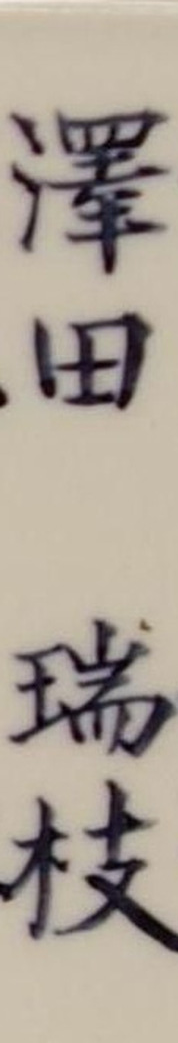澤田瑞枝
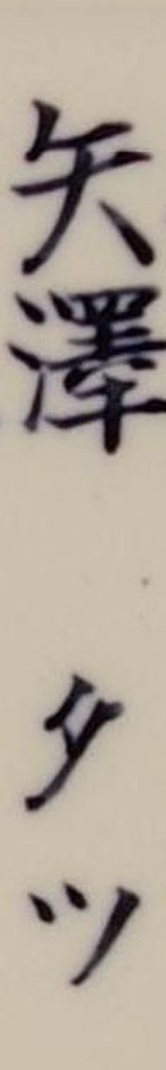矢澤タツ
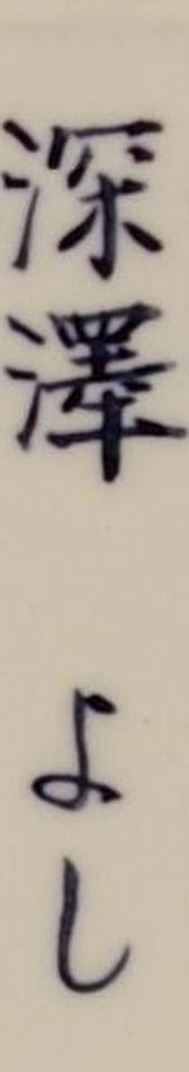深澤よし
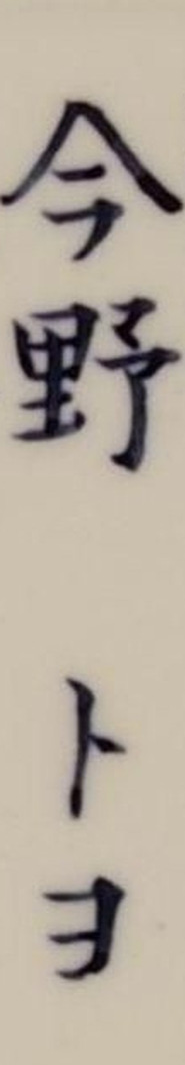今野トヨ
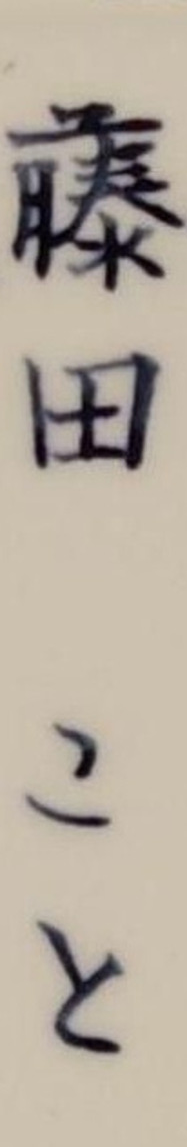藤田こと
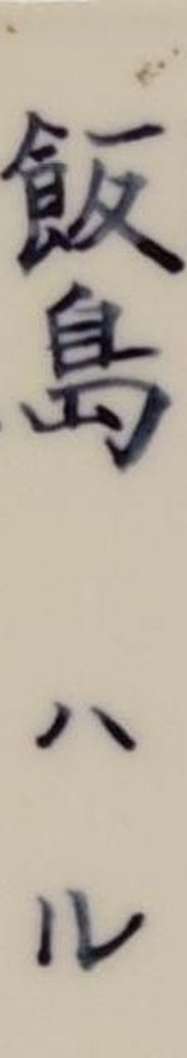飯島ハル
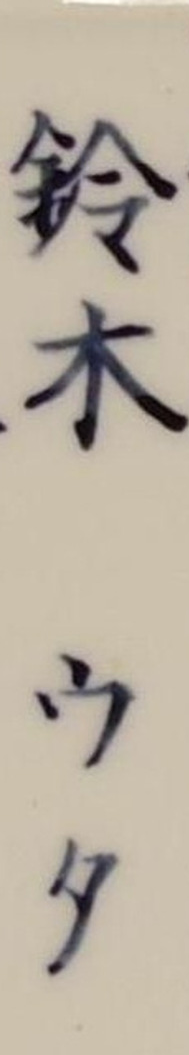鈴木ウタ
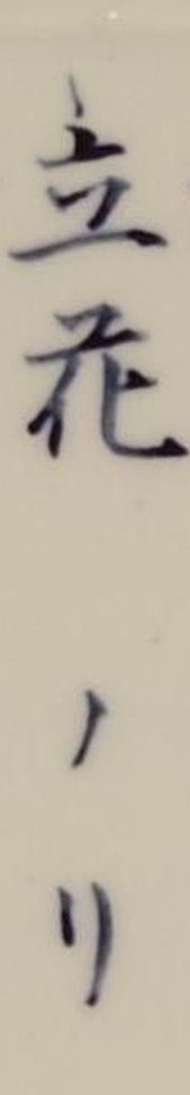立花ノリ
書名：M~S
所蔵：高野山金剛峯寺
